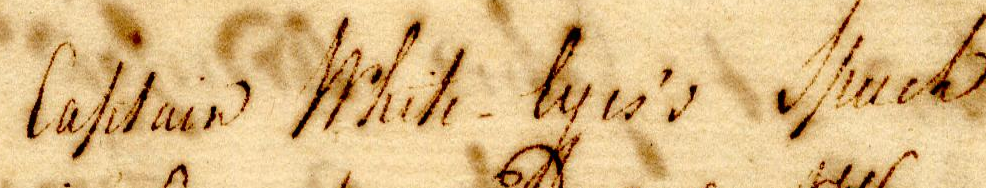Captain White-Eyes's Speech
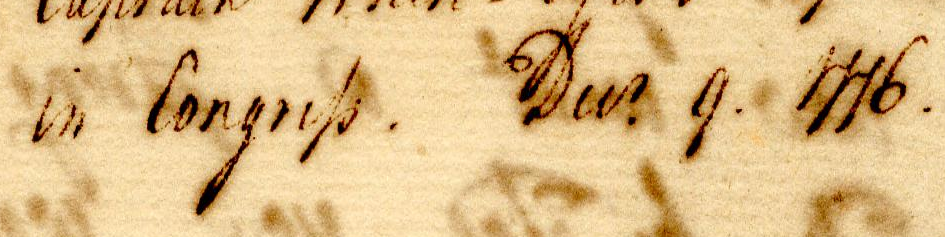in Congress. Dec^r. 9. 1776.
